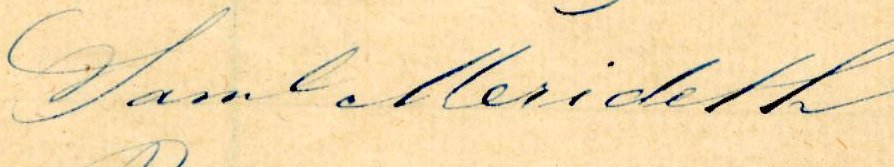Sam^l Merideth
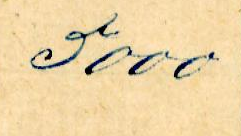5000
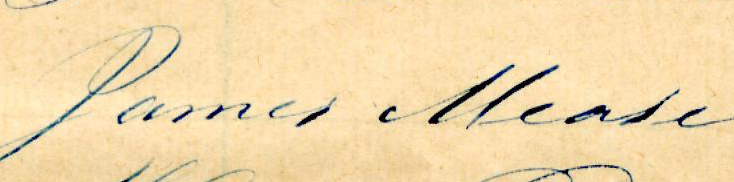James Mease
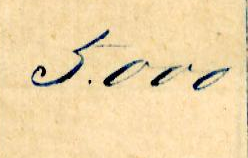5.000
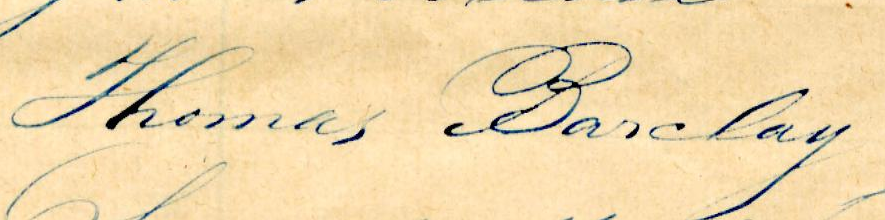Thomas Barclay
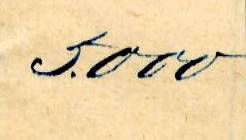5.000
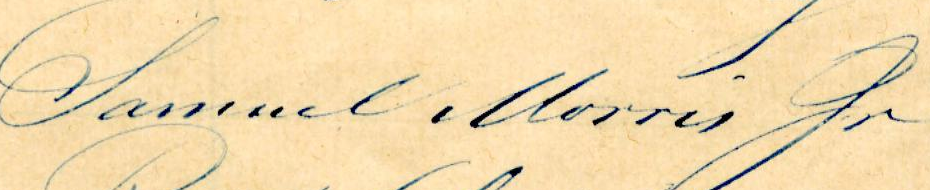Samuel Morris Jr
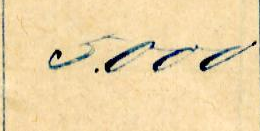5.000
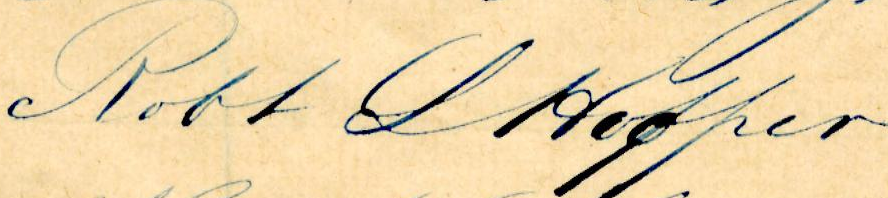Robt L Hopper
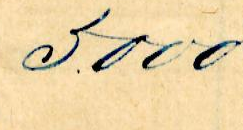5.000
